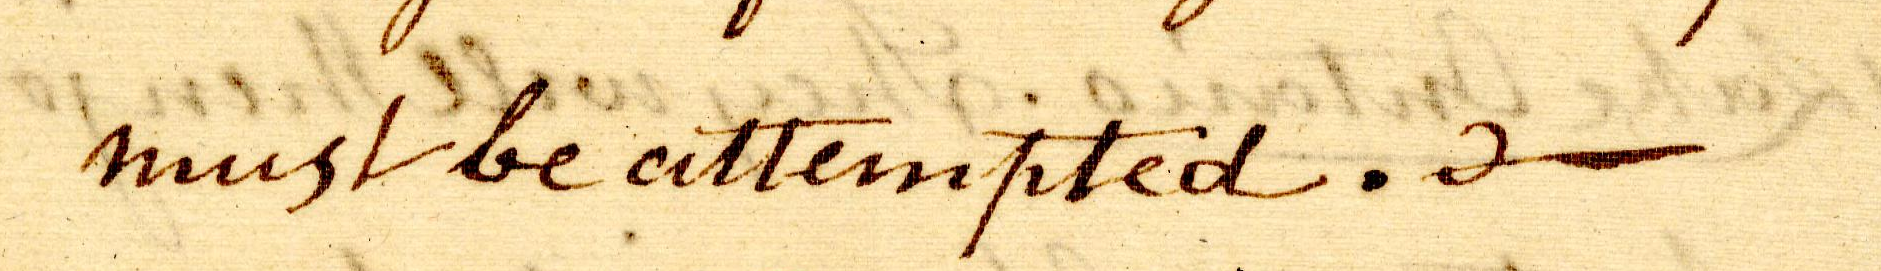must be attempted.-
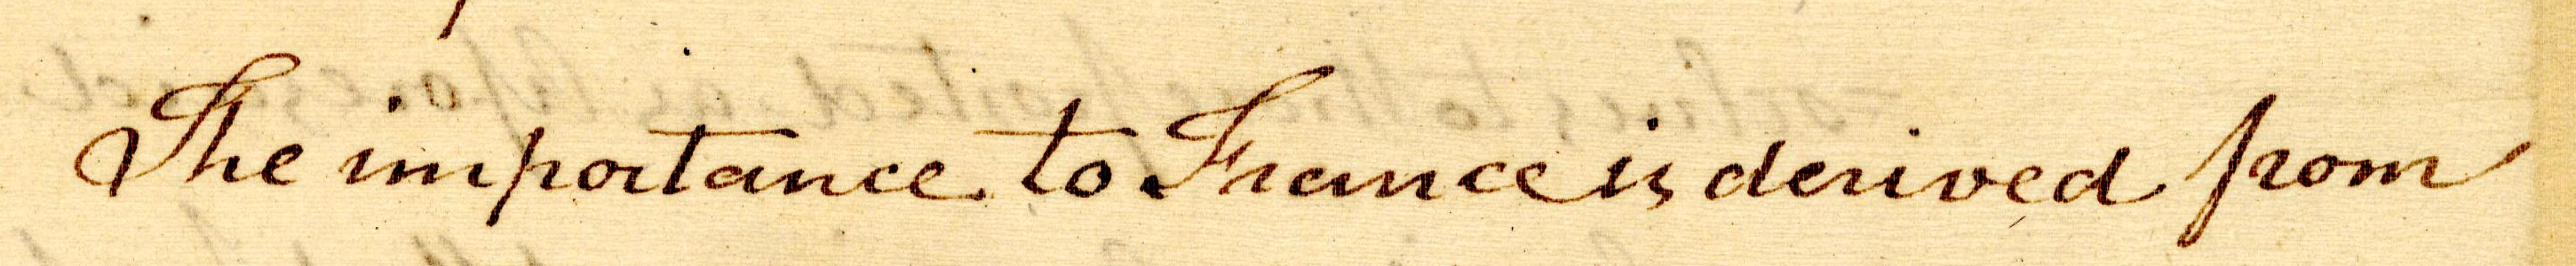The importance to France is derived from
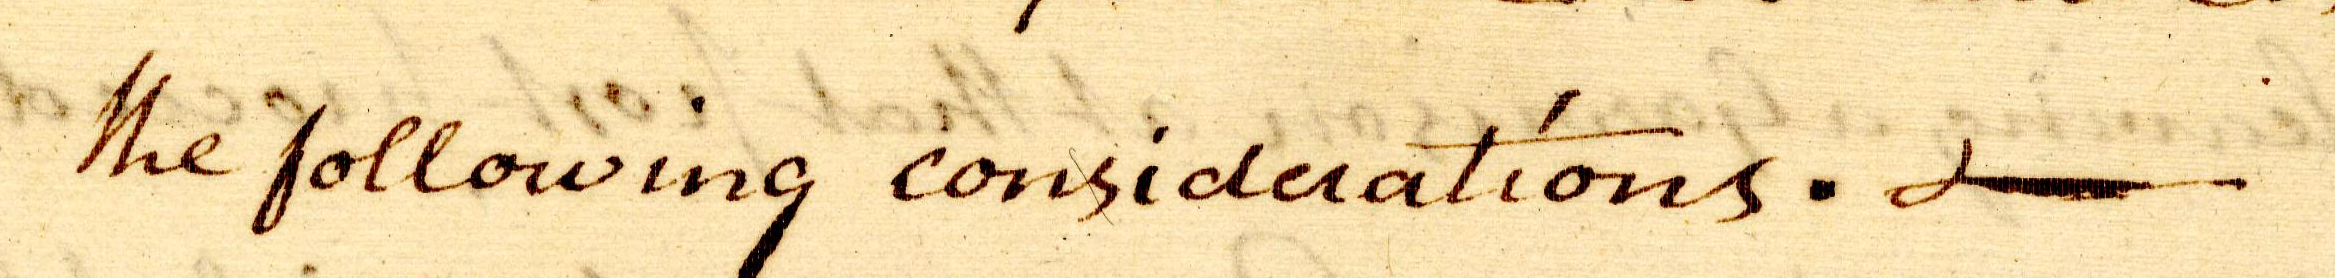the following considerations.-
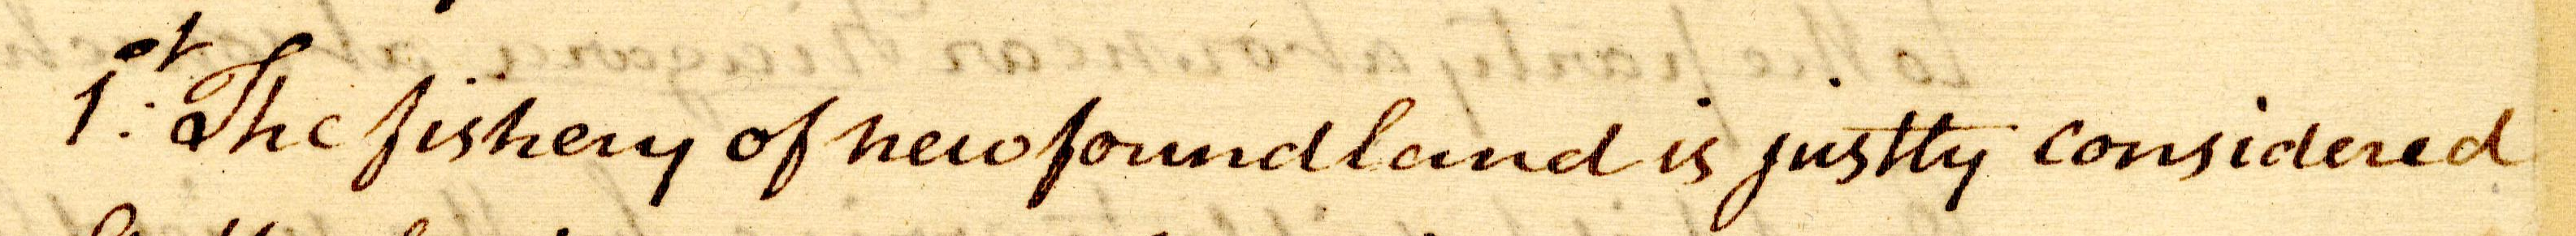1^st: The fishery of new foundland is justly considered
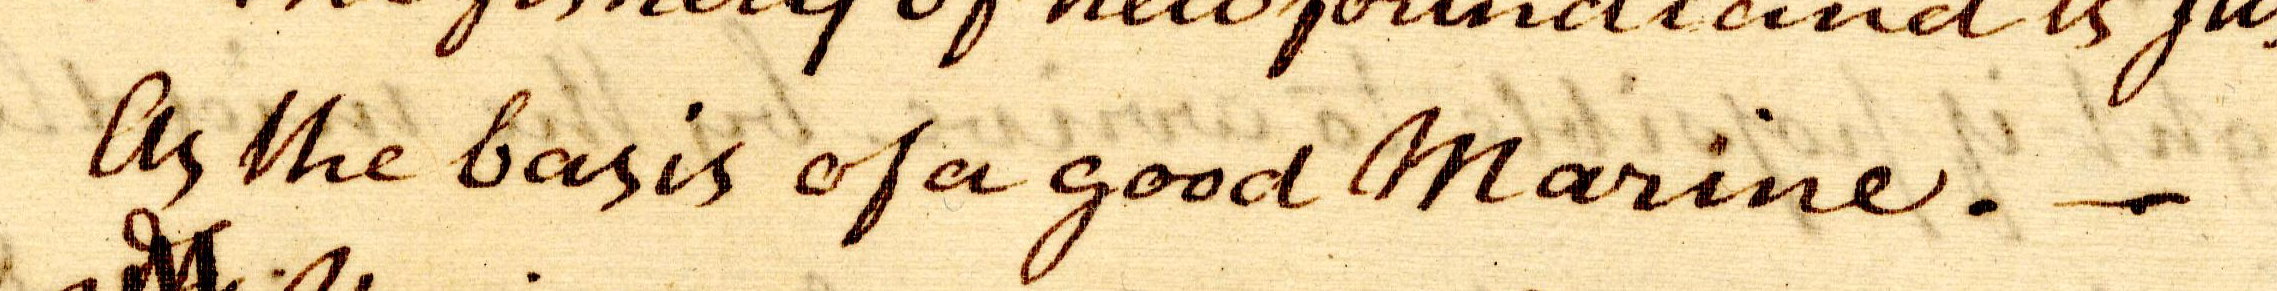Ay the basis of a good Marine.-
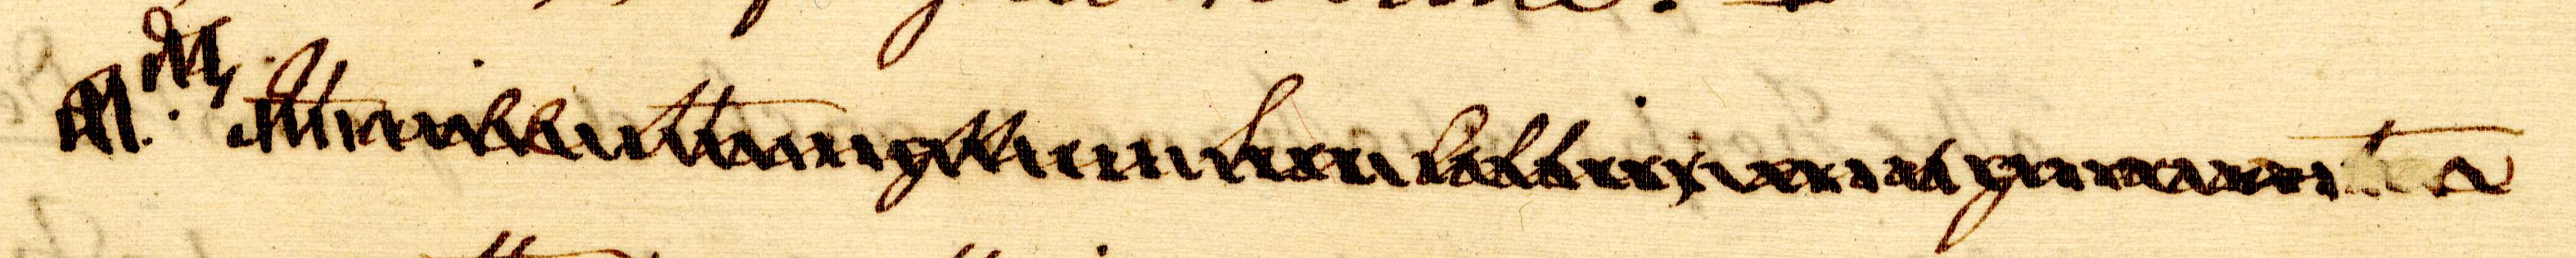[____________________________________________]
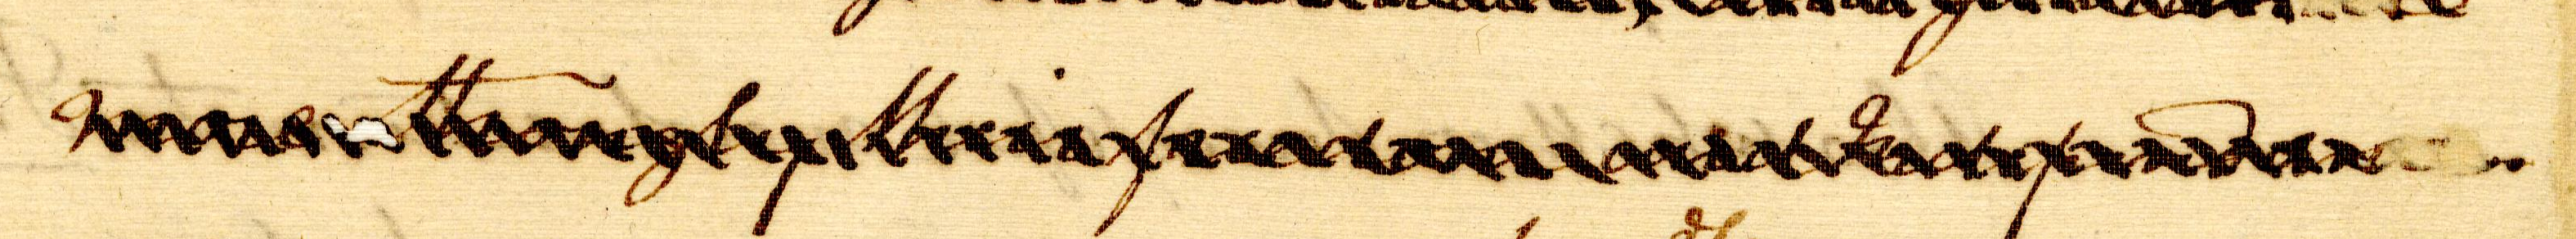[________________________________]
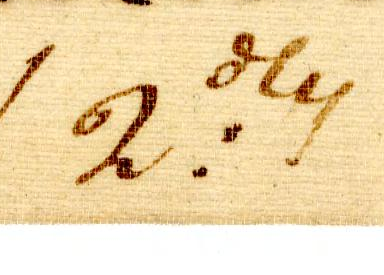2^dly:
